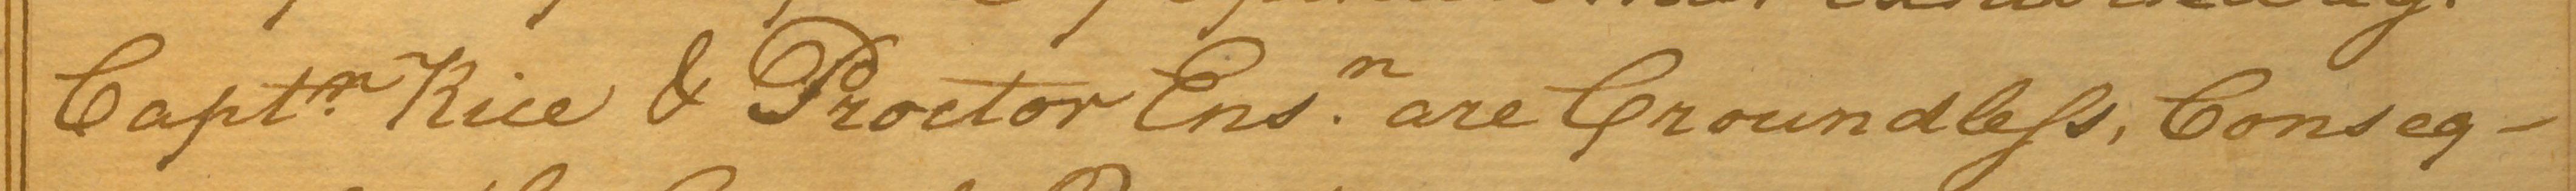Capt^n. Rice & Proctor Ens^n. are Groundless, Conseq-
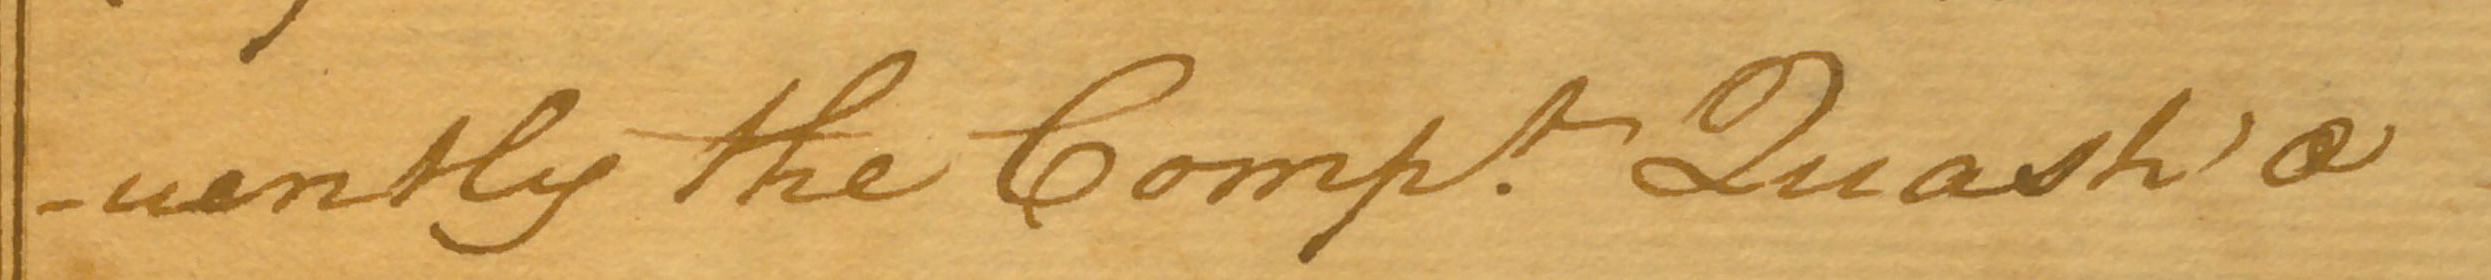-uently the Comp^t. Quash'd
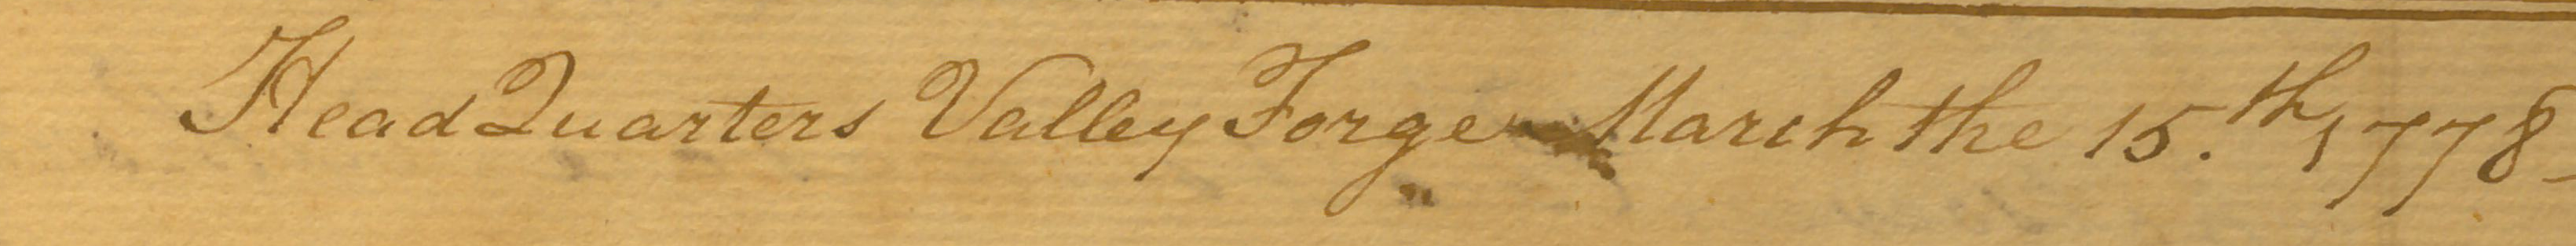Head Quarters Valley Forge March the 15^th. 1778
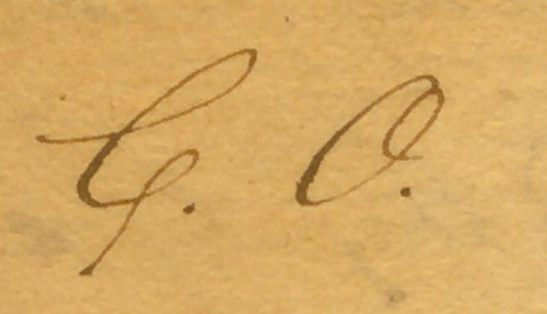G. O.
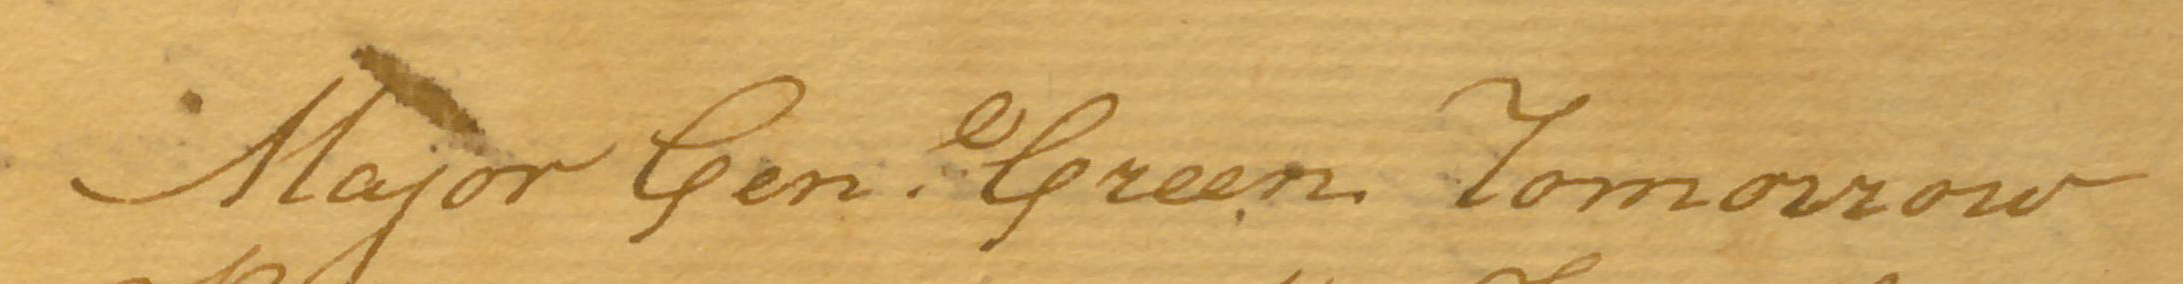Major Gen^l. Green Tomorrow
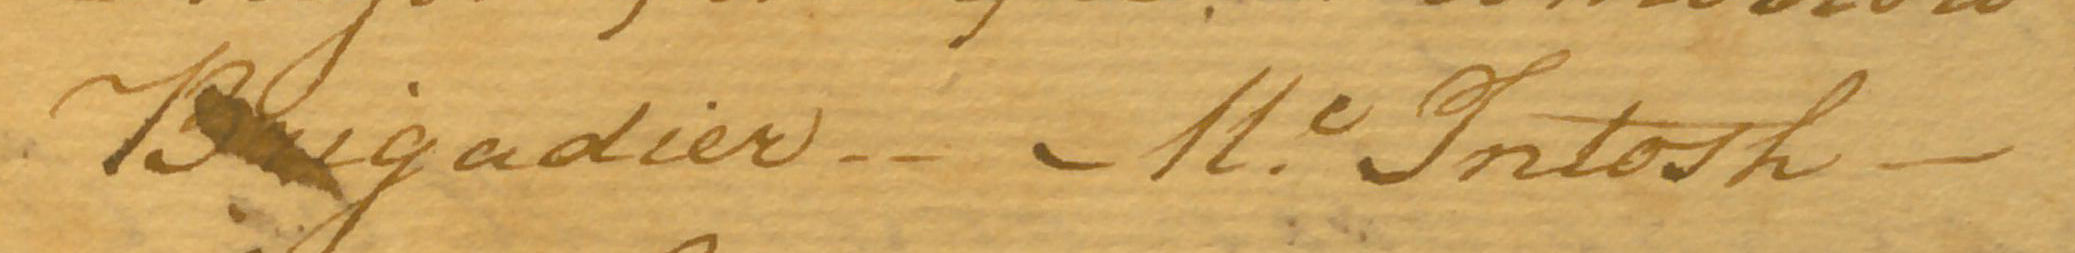Brigadier-- M^c.Intosh-
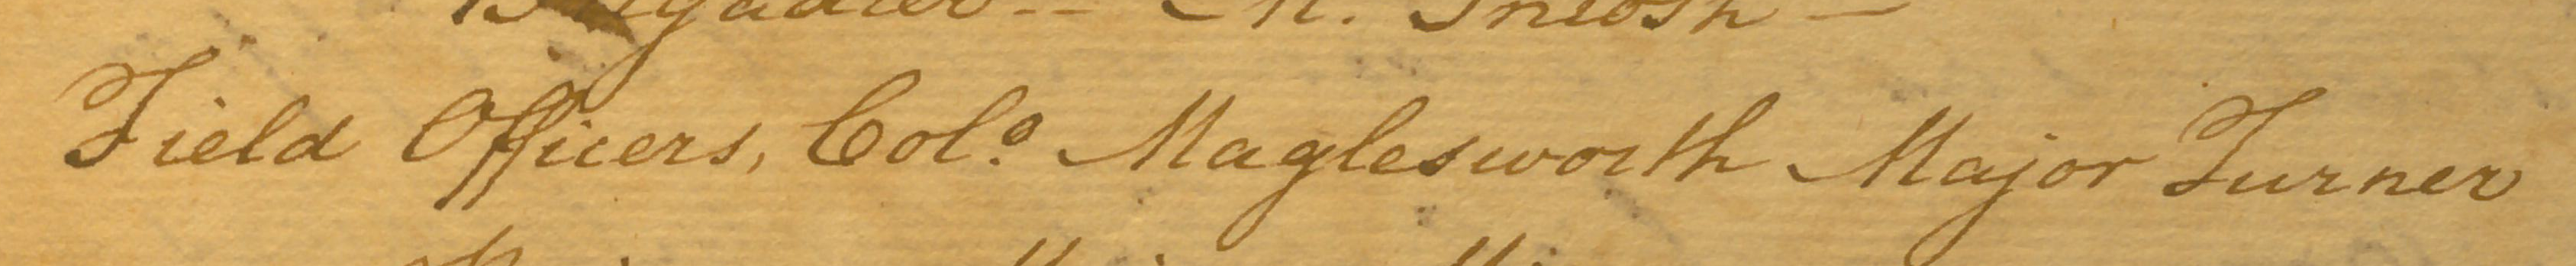Field Officers, Col^o. Maglesworth Major Turner
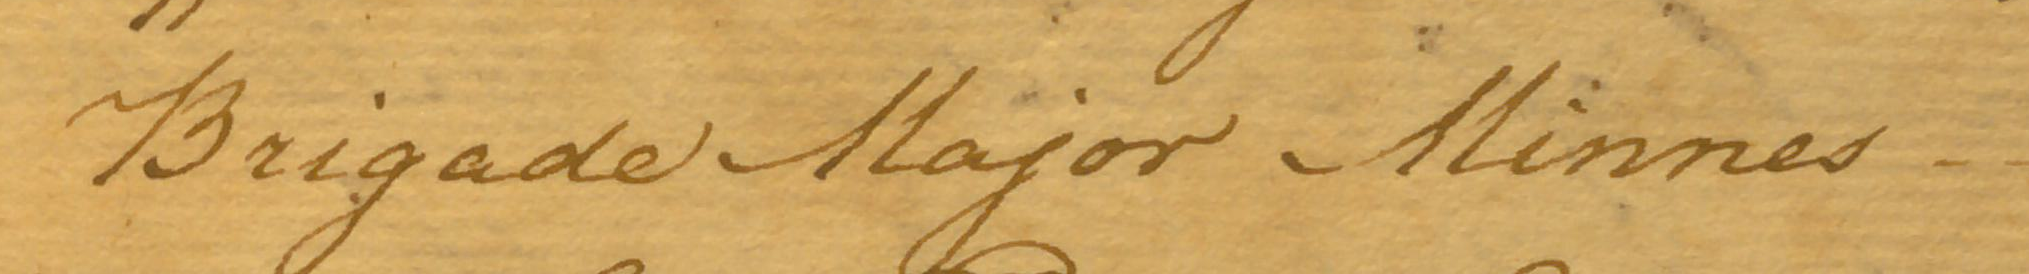Brigade Major Minnes-
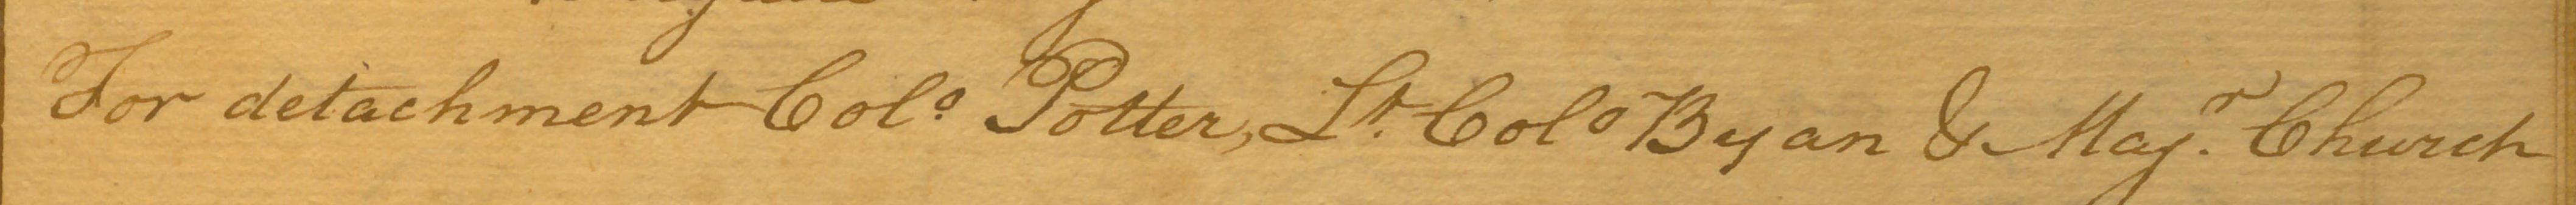For detachment Col^o. Potter, L^t. Col^o. Byan & Maj^r. Church
